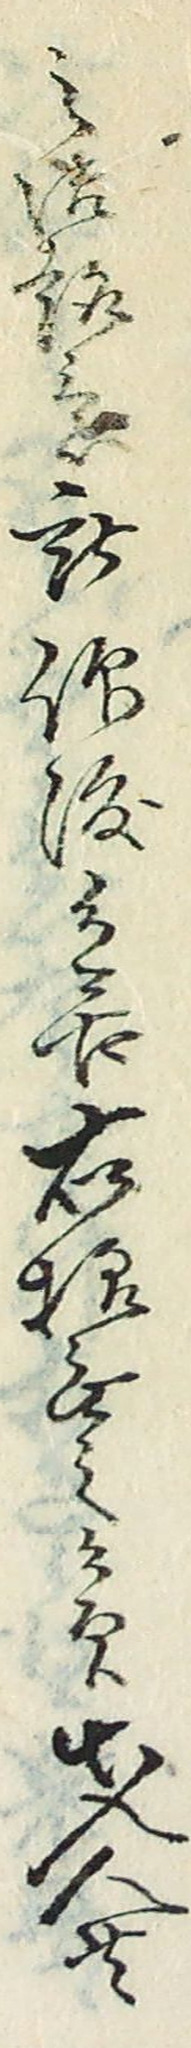之御趣意被仰渡候筈右様無之候而ハ出入人共
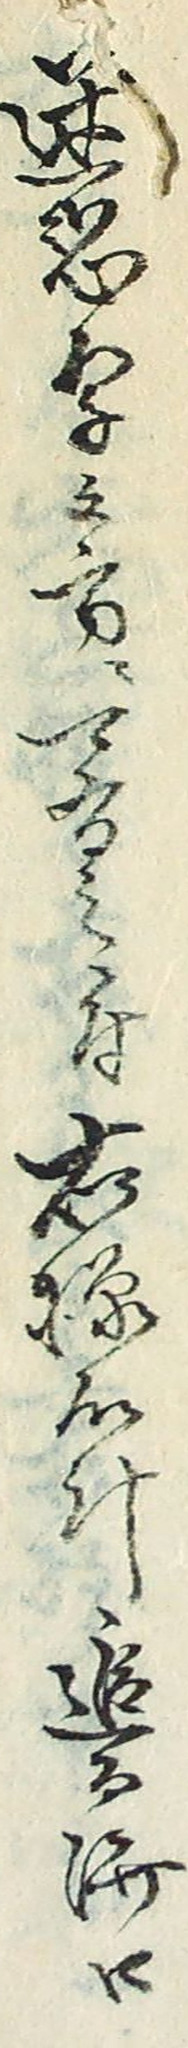迷惑孕候方ニ可有之ニ付右様取計追而済口
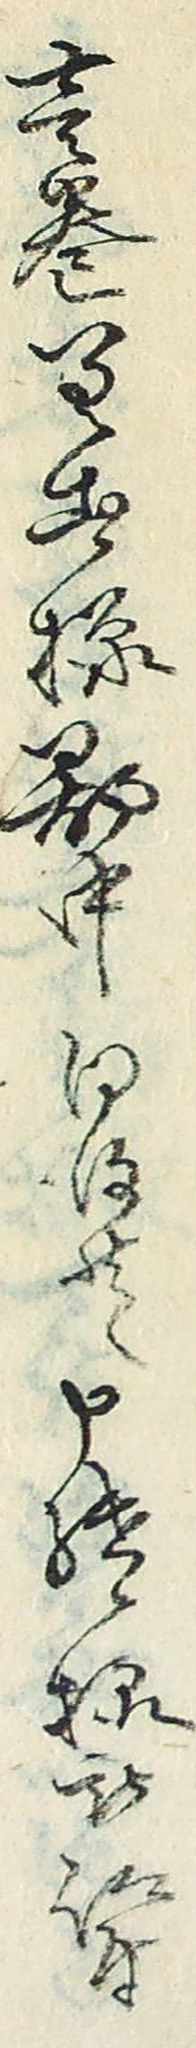壱巻差出候様郡中同役共へ申継候様被仰付
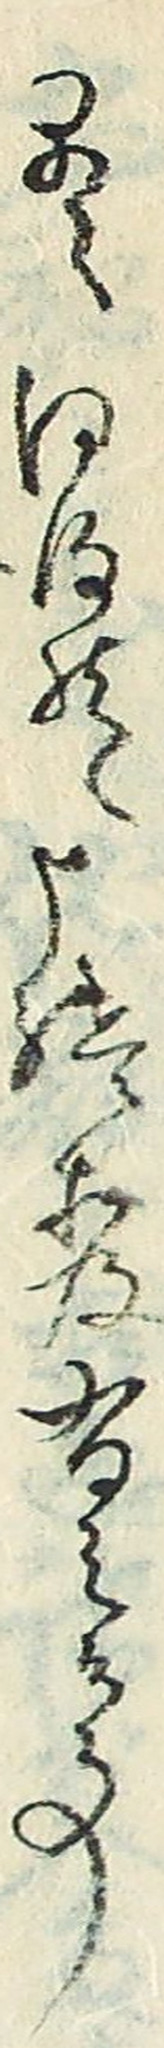早々同役共へ申継ニ相及有之候事

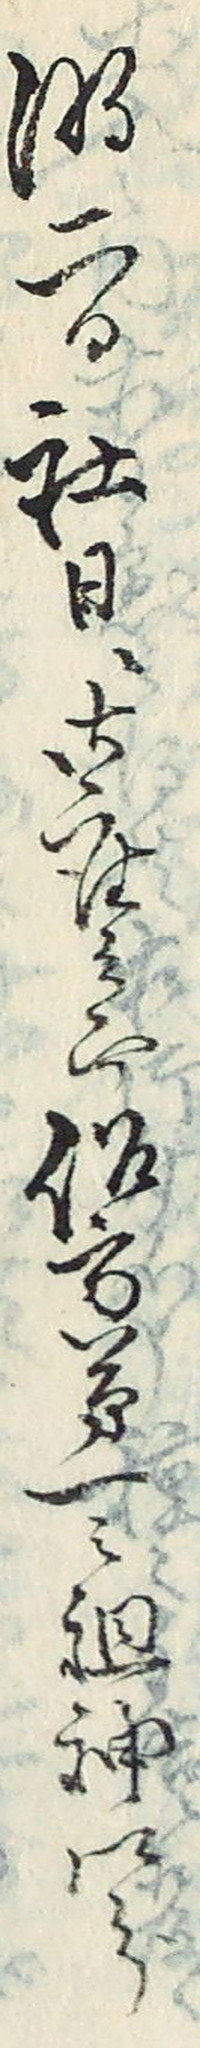明二日社日ニ御座候而作方第一之祖神郷分
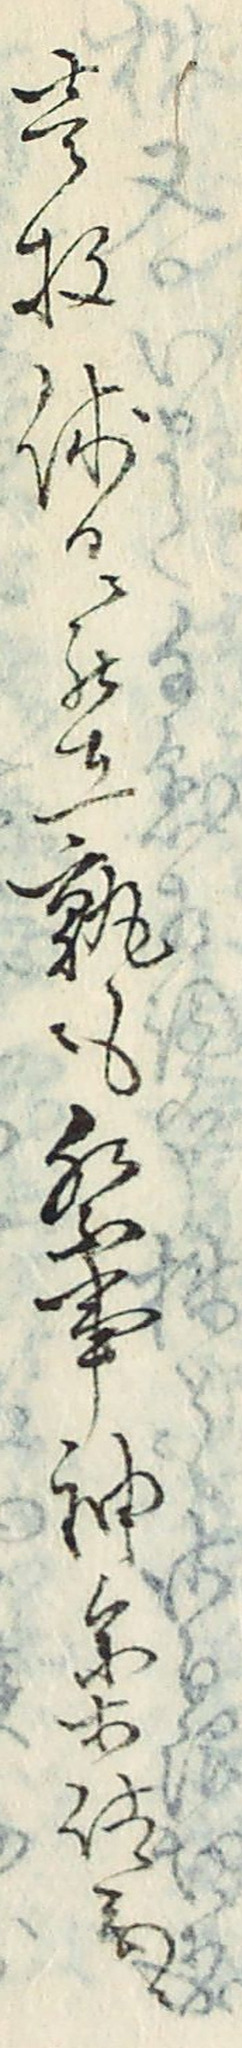壱牧休日ニ罷在孰も祭事神参等仕候義ニ
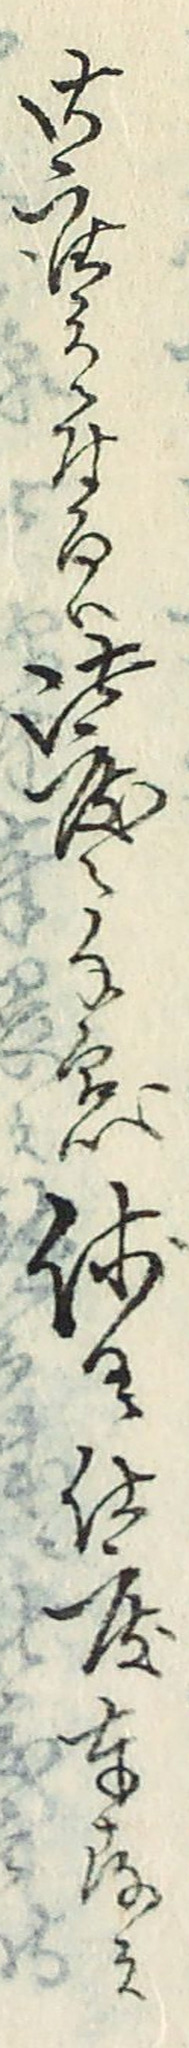御座候ニ付而ハ此度之手懸休日ニ仕度奉存候
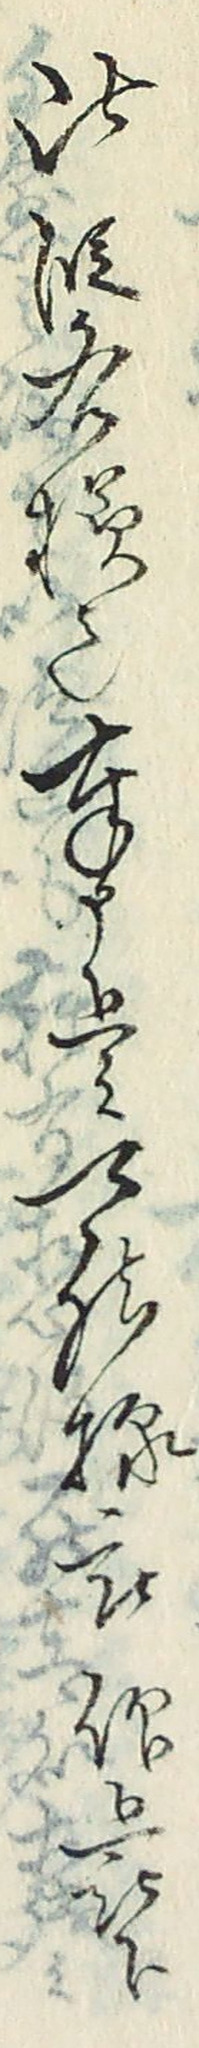此段右様迄奉申上候可然様被仰上被下
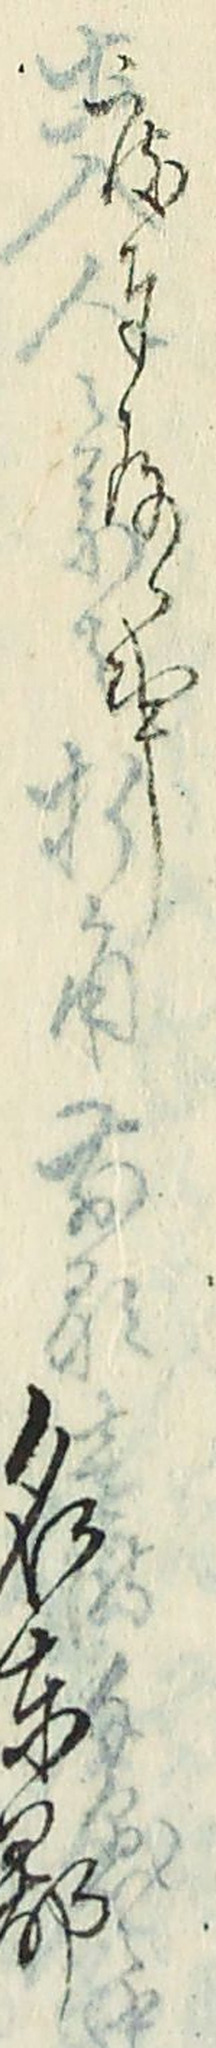度奉存候事名東郡
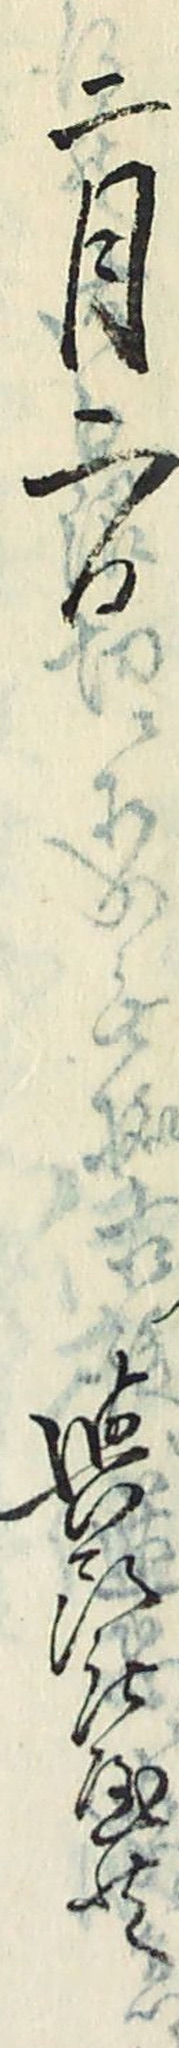二月二日與頭庄屋共
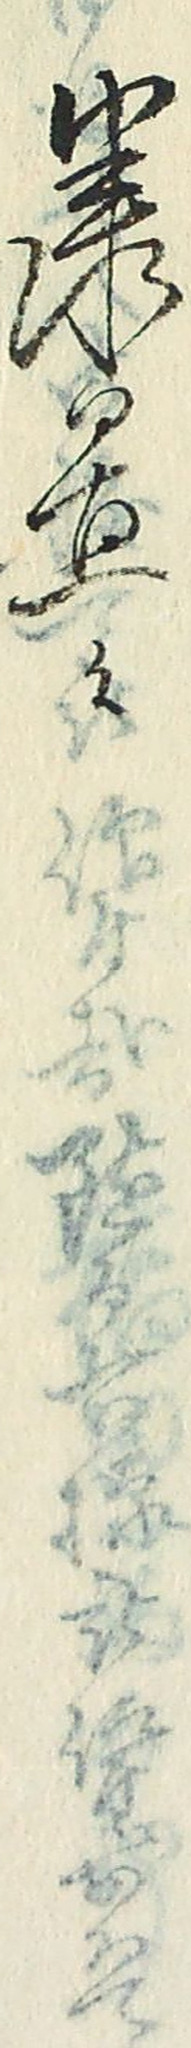承置候

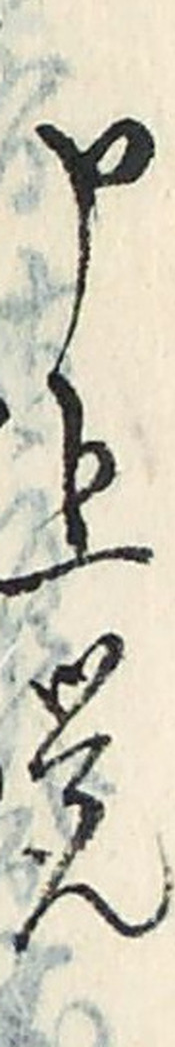申上覚
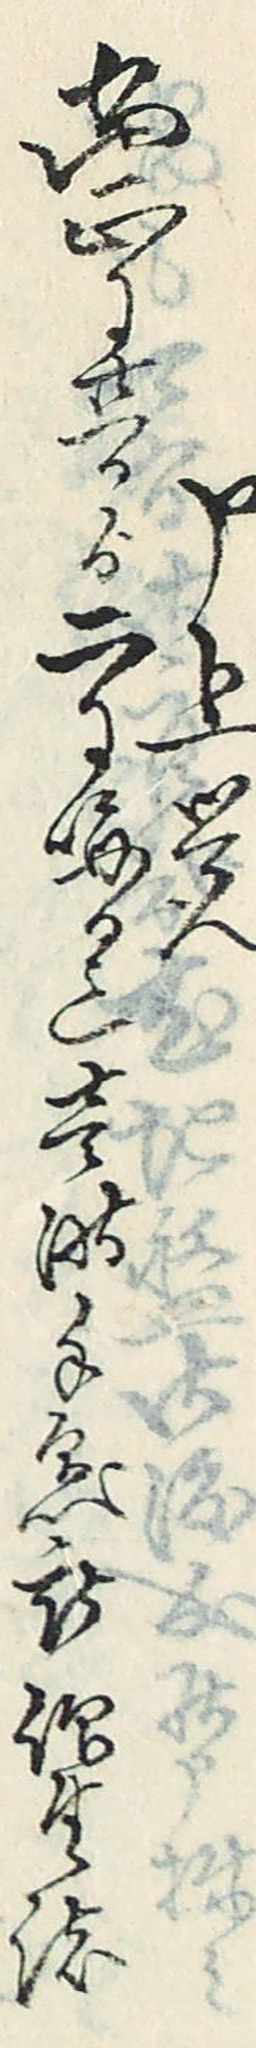當正月廿一日ゟ二月晦日迄壱時手懸被仰付候諸
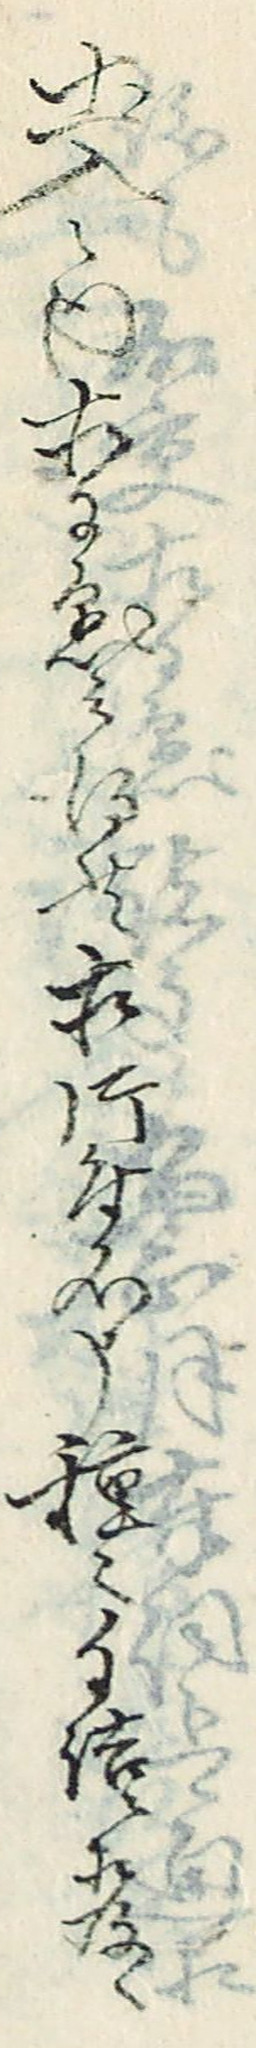出入之内相手懸候得共相片付不申種々手詰ニ相及候
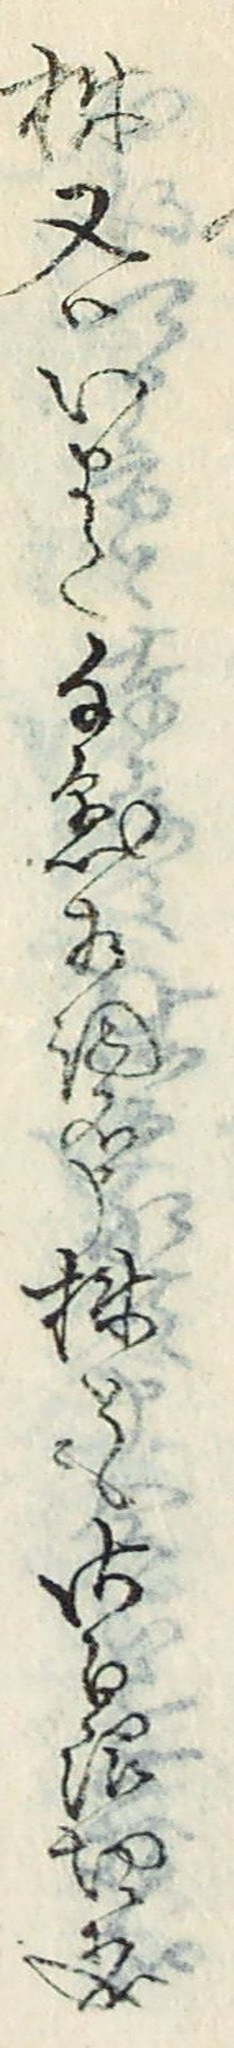株又ハいまた手懸相調不申株とも御日限切ニ相成
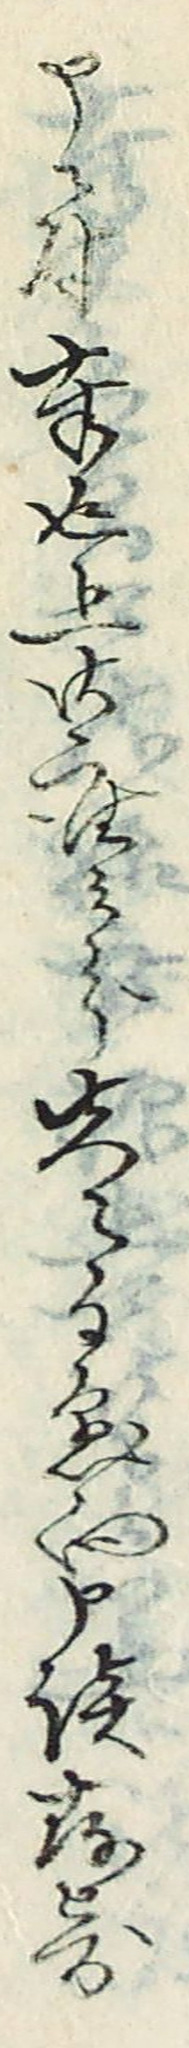申ニ付奉返上御座候分夫々手懸向申談存寄
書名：諸御趣意書并御下知向之写
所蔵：鳴門教育大学 Naruto University of Education
